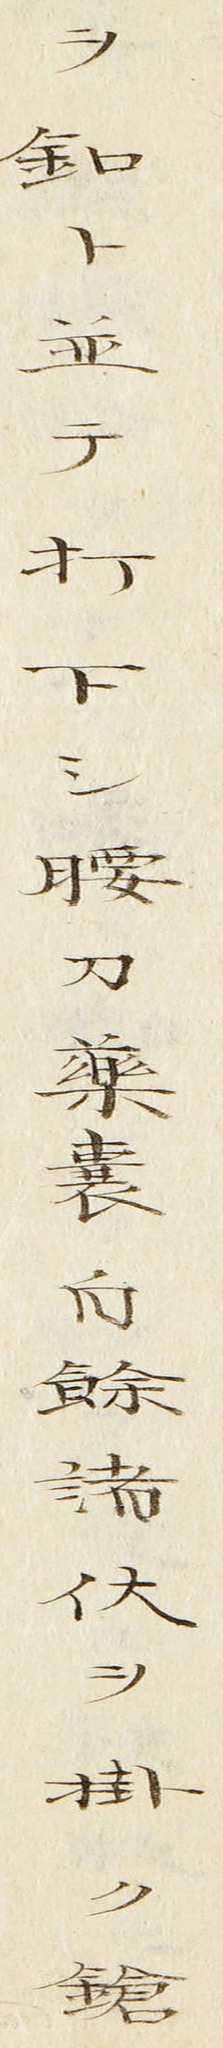ヲ釦ト並テ打下シ腰刀薬嚢自余諸伏ヲ掛ク鎗
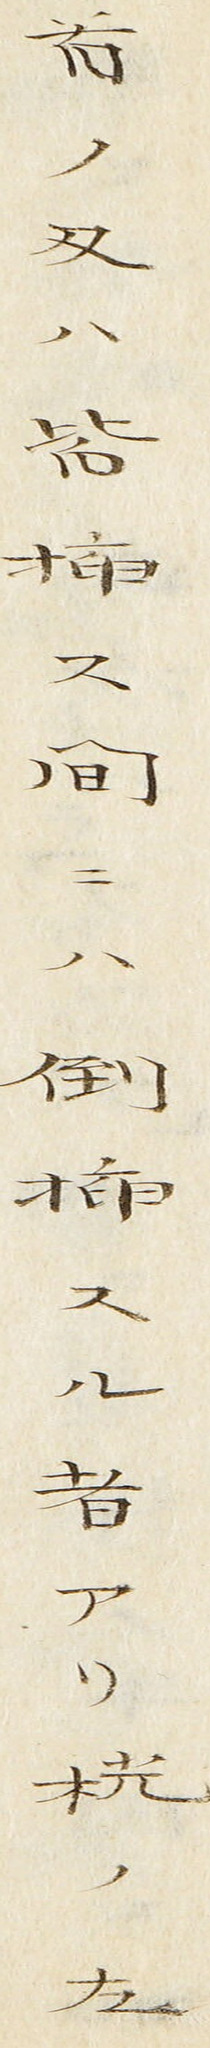首ノ及ハ皆ス間ニハ倒挿スル者アリ桄ノ左
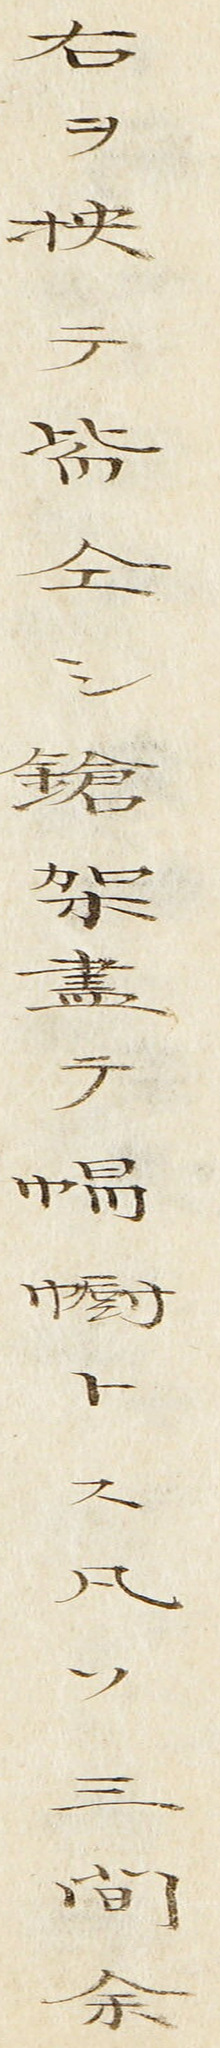右ヲ挟テ皆仝シ鎗架尽テ帽橱トス凡ソ三間余
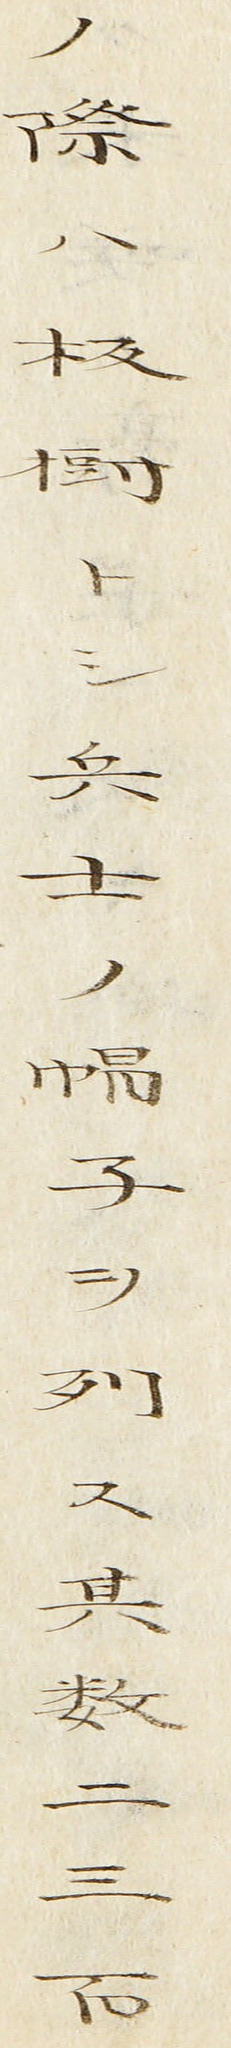ノ際ハ板橱トシ兵士ノ帽子ヲ列ス其数二三百
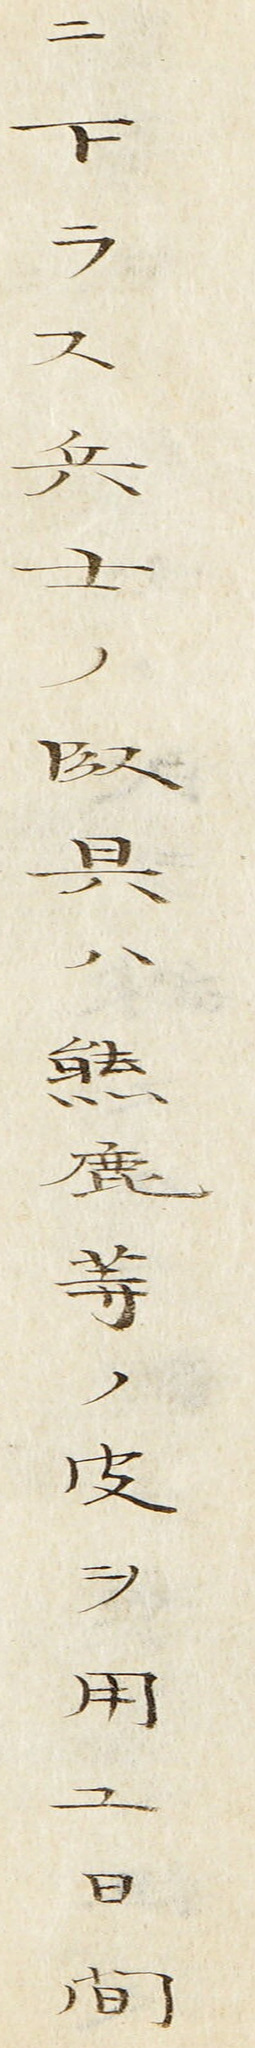ニ下ラス兵士ノ臥？具ハ熊鹿等ノ皮ヲ用ユ日間
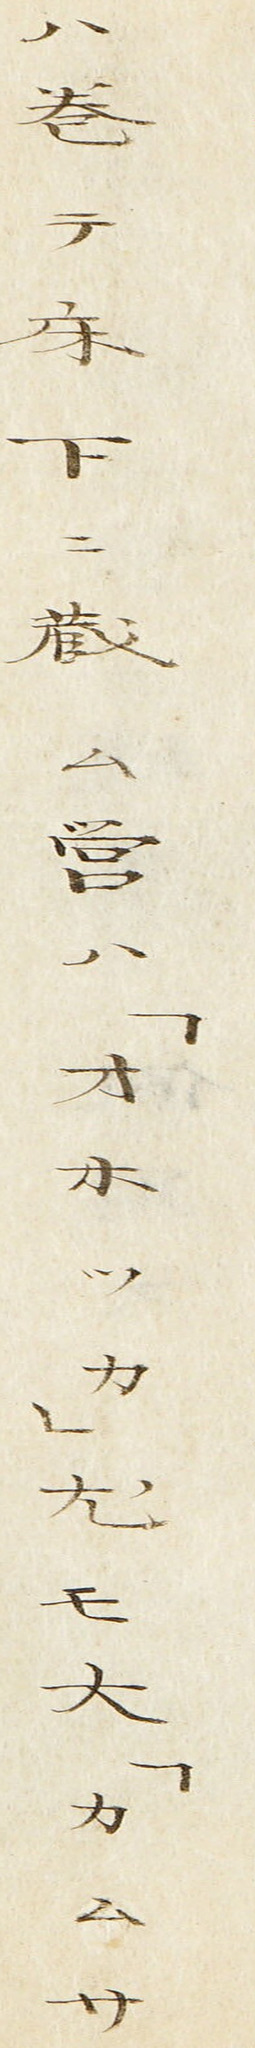ハ巻テ床下ニ蔵ム営ハ「オホツカ」尤モ大「カムサ
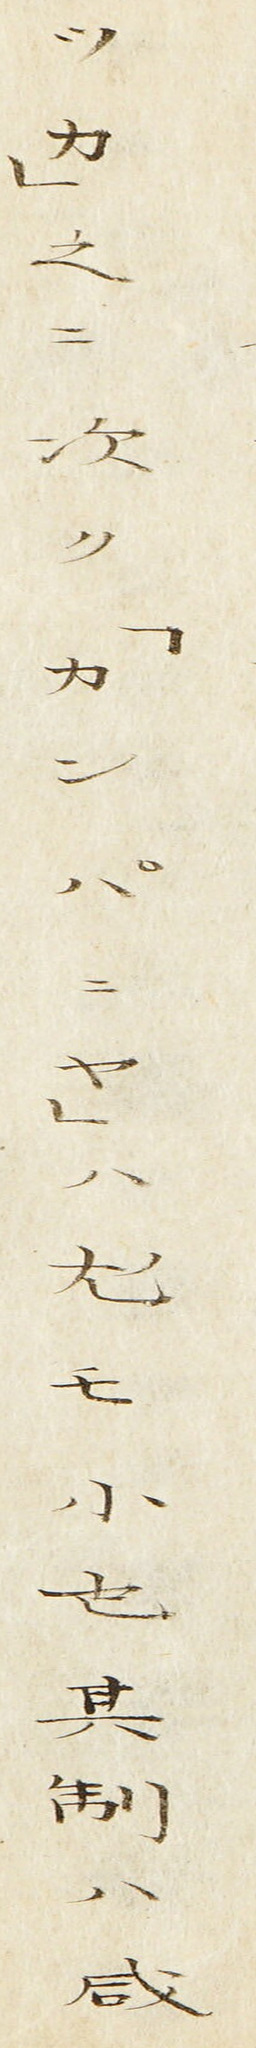ツカ」之ニ次ク「カンパニヤ」ハ尤モ小也其制ハ咸
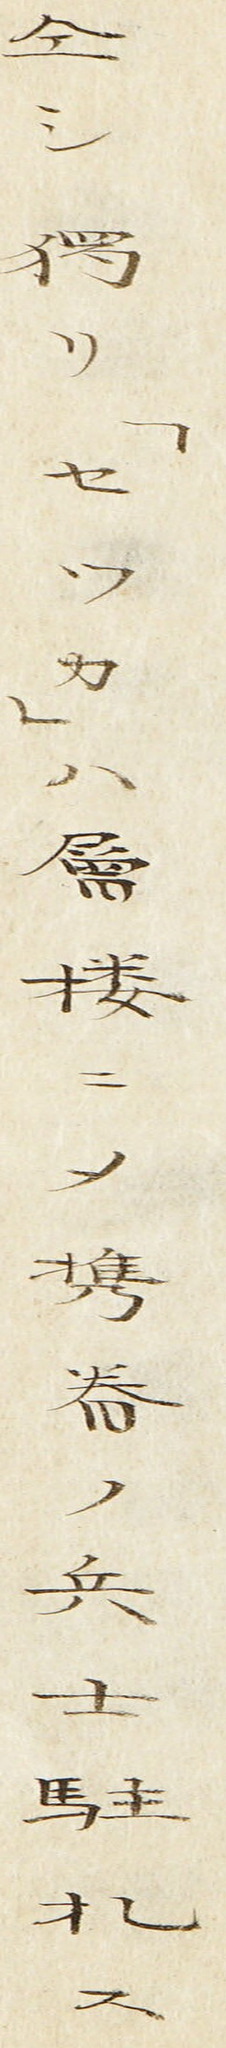仝シ独リ「セツカ」ハ層楼ニシテ携眷ノ兵士駐札ス
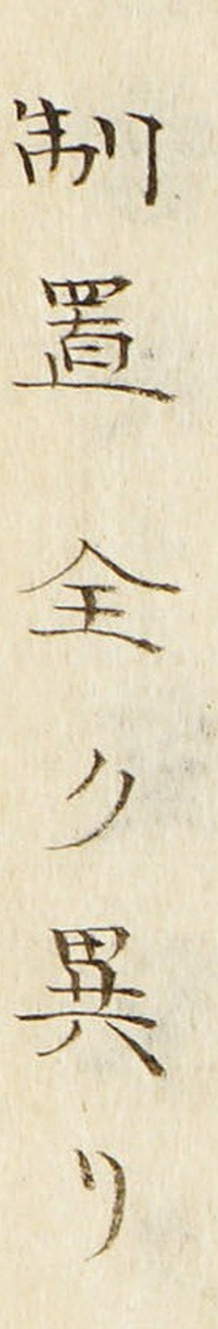制置全ク異リ

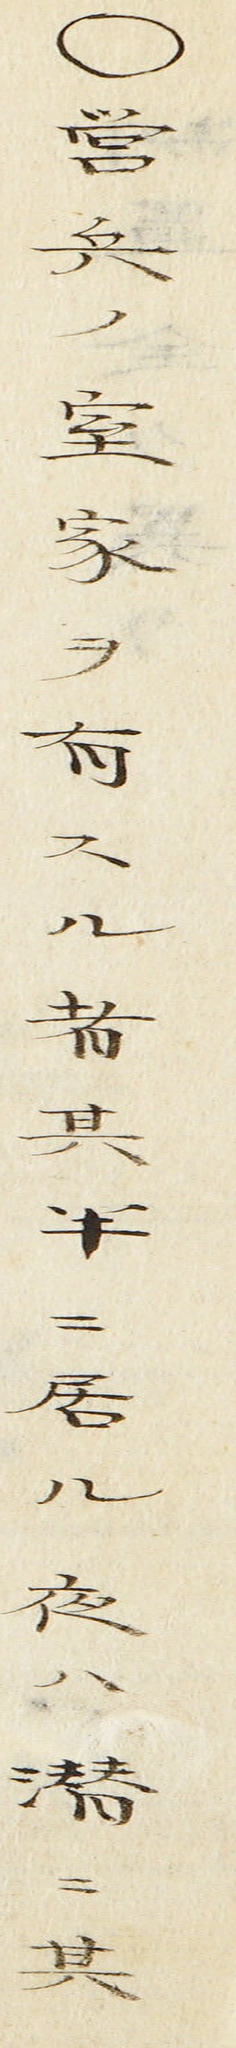〇営兵ノ室家ヲ有スル者其半ニ居ル夜ハ潜ニ其
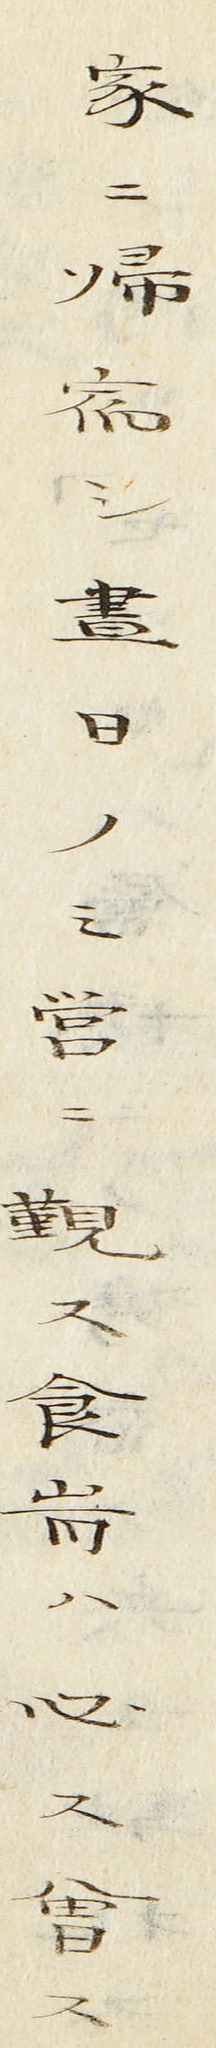家ニ帰宿シ昼日ノミ営ニ覲ス食時ハ必ス会ス
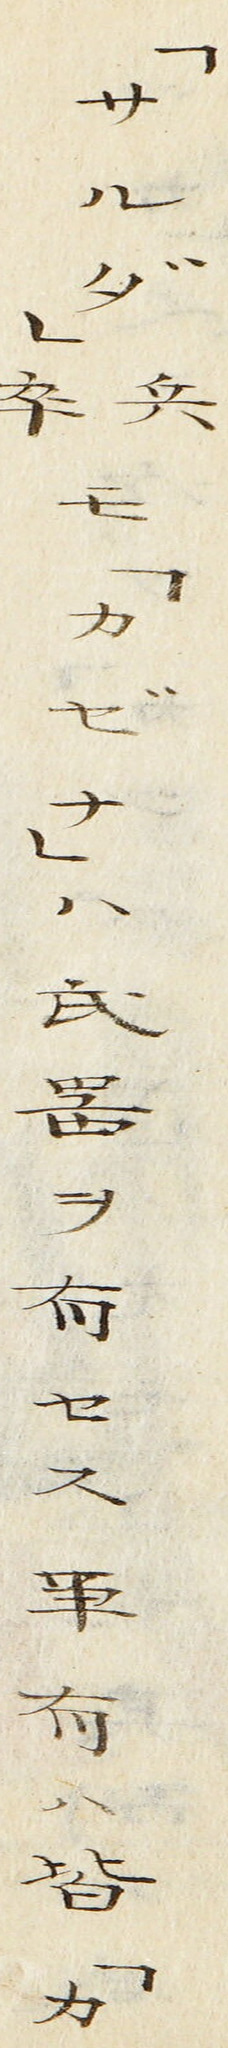「サルダ」兵卒モ「カゼナ」ハ武器ヲ有セス事有ハ皆「カ
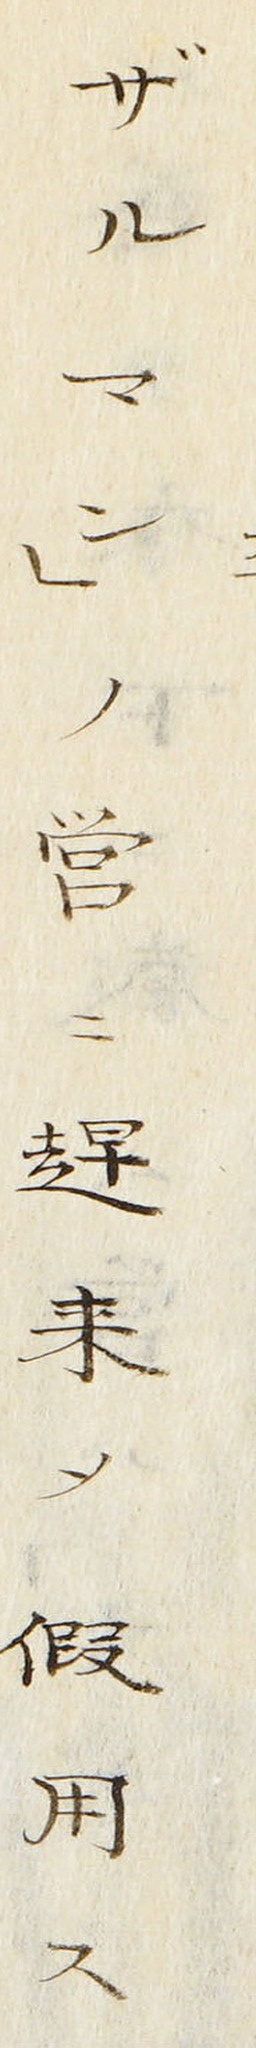ザルマン」ノ営ニ趕？来シテ仮用ス
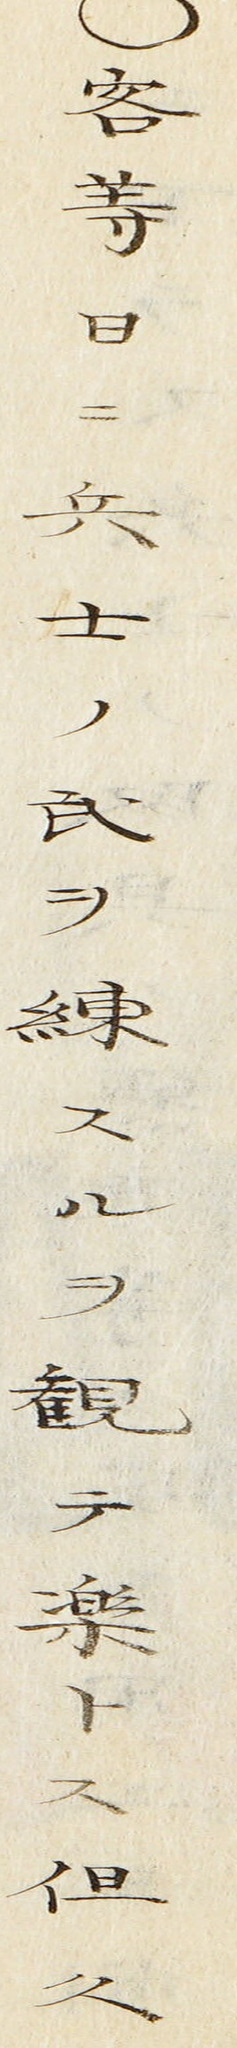〇客等日ニ兵士ノ武ヲ練スルヲ観テ楽トス但久
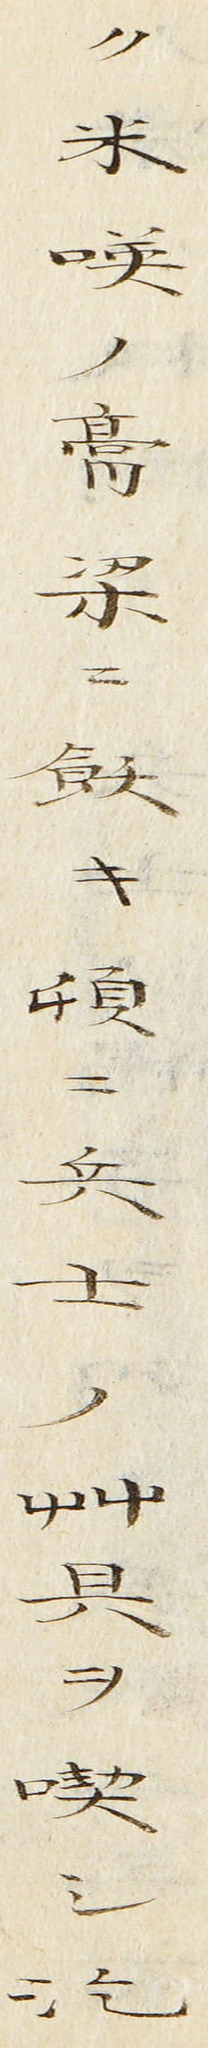ク米ノ膏梁ニ飫キ頓ニ兵士ノ艸具ヲ喫シ汔
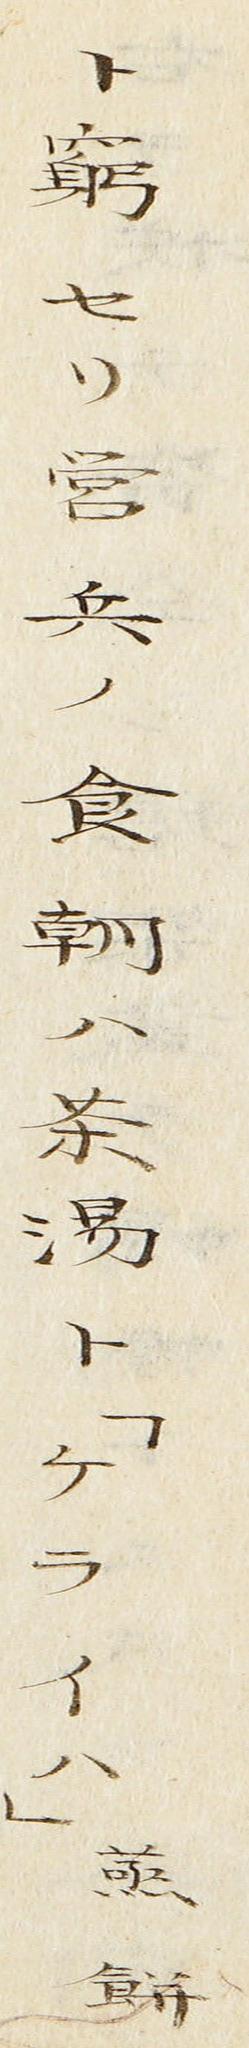ト窮セリ営兵ノ食朝ハ茶湯ト「ケライハ」蒸餅ヲ
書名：蕃談
